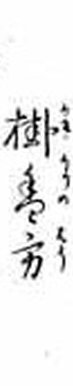掛香方
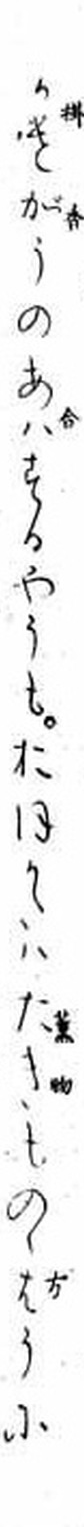かけがうのあはするやうも。おほかたはたきものゝはうに
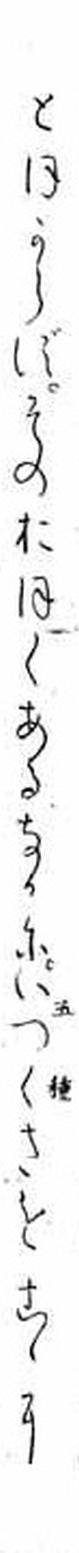とほからず。そのおほくあるなかに。いつくさをこゝに
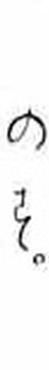のす。
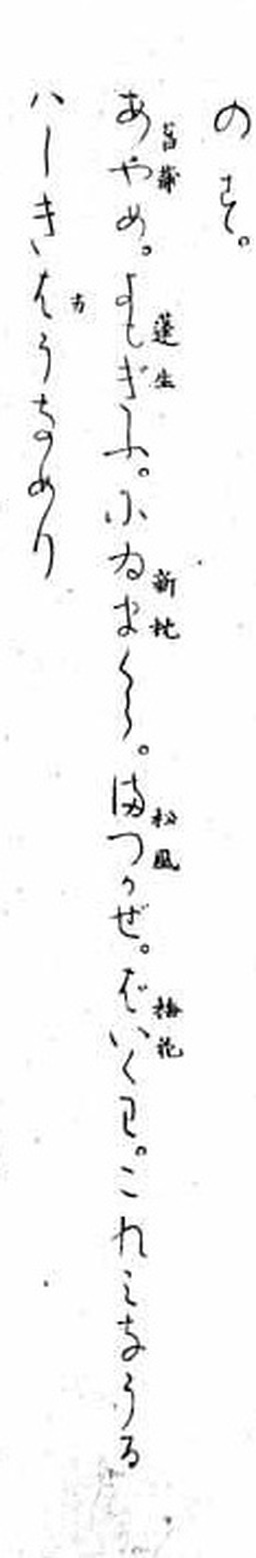あやめ。よもぎふ。にゐまくら。まつかぜ。ばいくわ。これみなうる

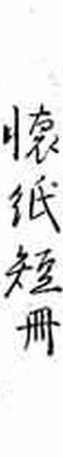懐紙短冊
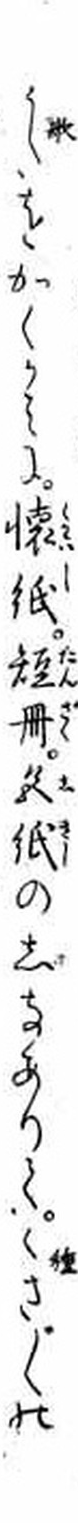うたをかくかみに。懐紙。短冊。色紙のしなありて。くさ〴〵の
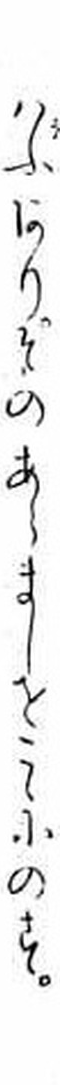はふあり。そのあらましをこゝにのす。
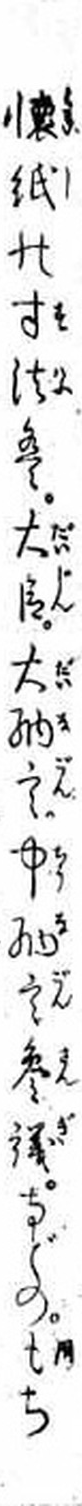懐紙の寸法は。大臣。大納言。中納言参議。などの。もち
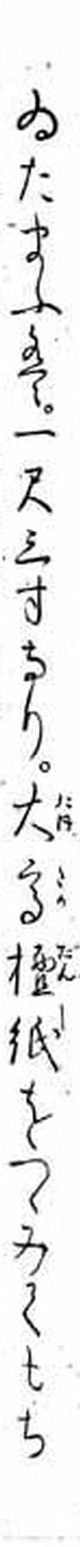ゐたまふは。一尺三寸なり。大高檀紙をつゝみてもち
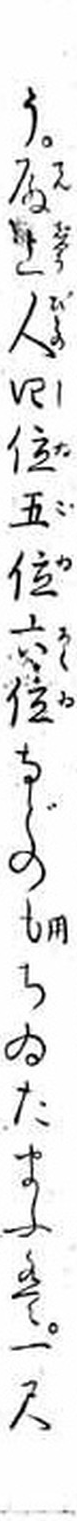う。殿上人四位五位六位などのもちゐたまふは。一尺
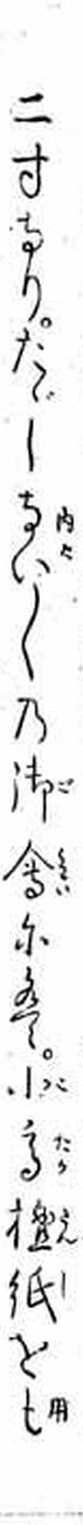二寸なり。たゞしない〳〵の御会には。小高檀紙をも
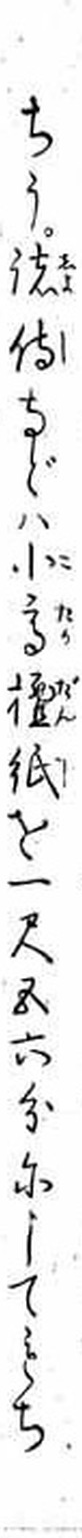ちう。諸侍などは小高檀紙を一尺五六分にしてもち
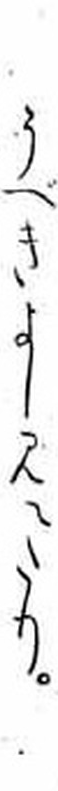うべきよし見えたり。
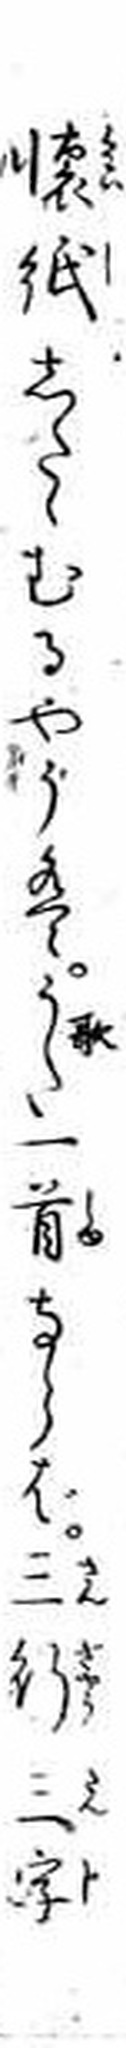懐紙したゝむるやうは。うた一首ならば。三行三字
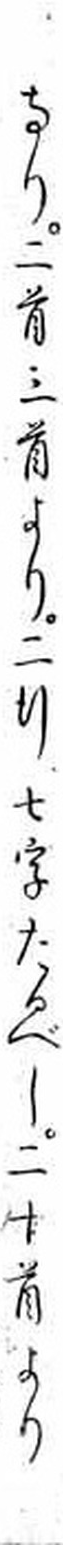なり。二首三首より。二行七字たるべし。二十首より
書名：女学範
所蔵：東京学芸大学教育コンテンツアーカイブ
